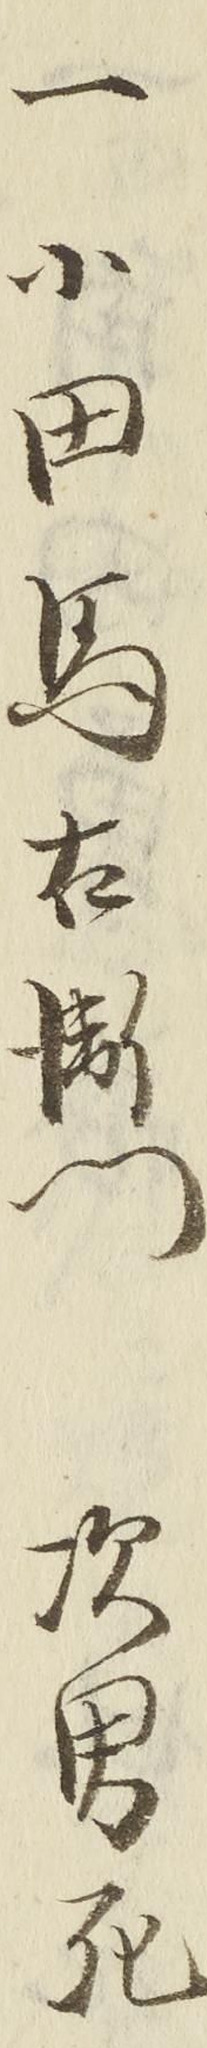一小田馬衛門次男死
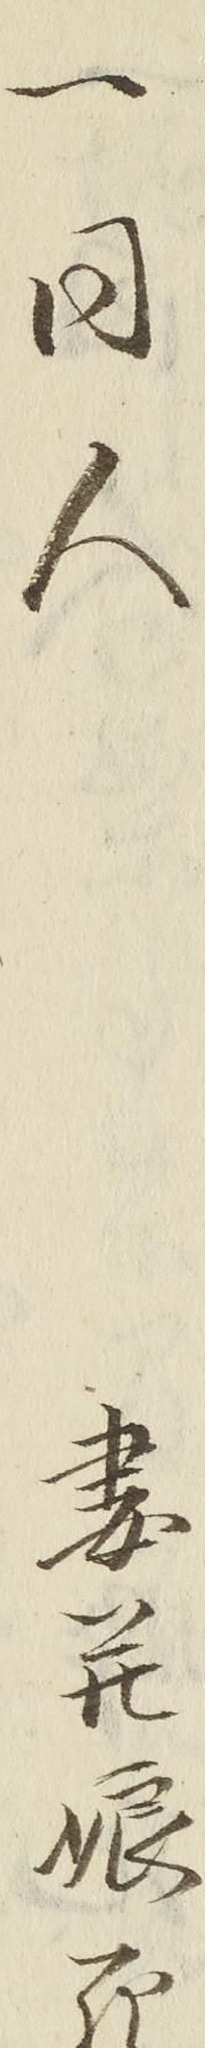一同人妻并娘死
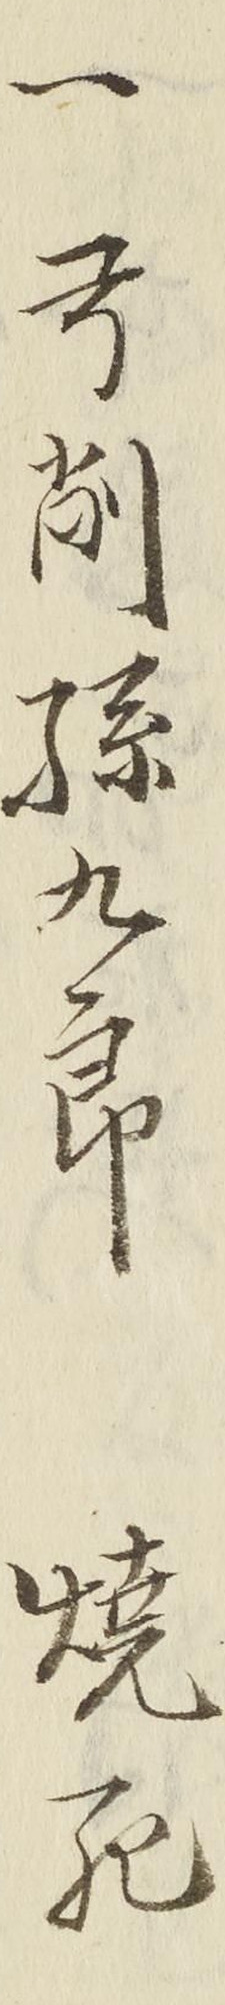一弓削孫九郎焼失
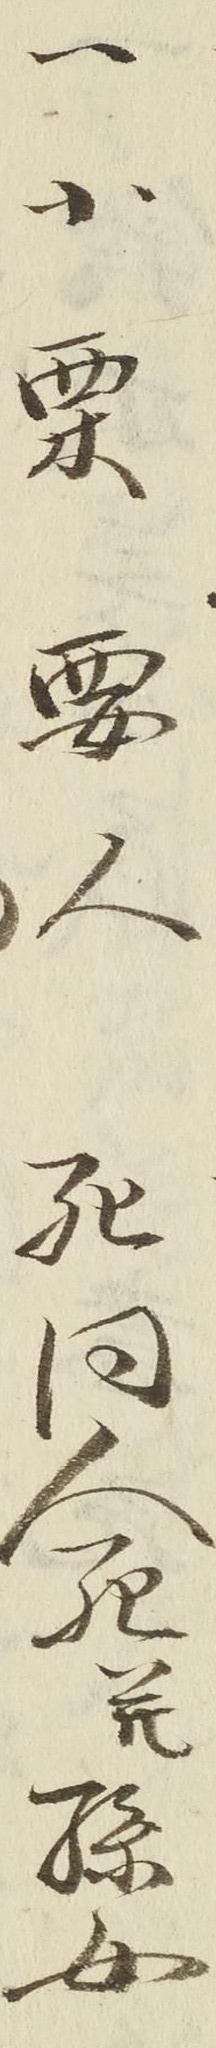一小西要人死同人死并孫共
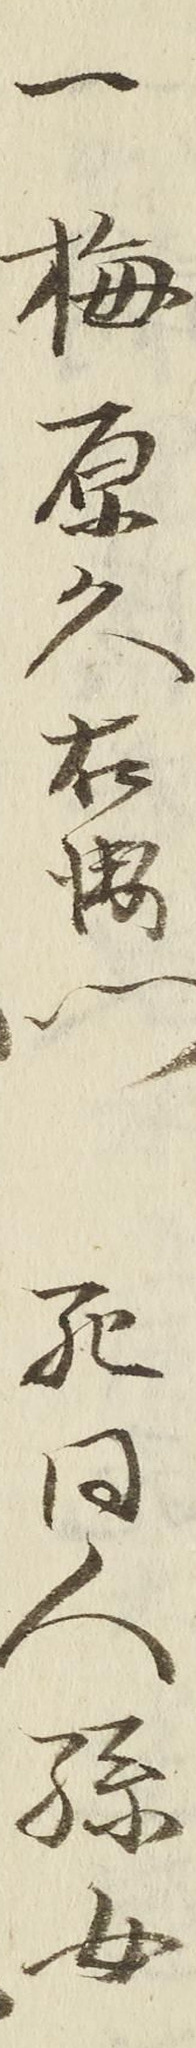一梅原久右衛門死同人孫共
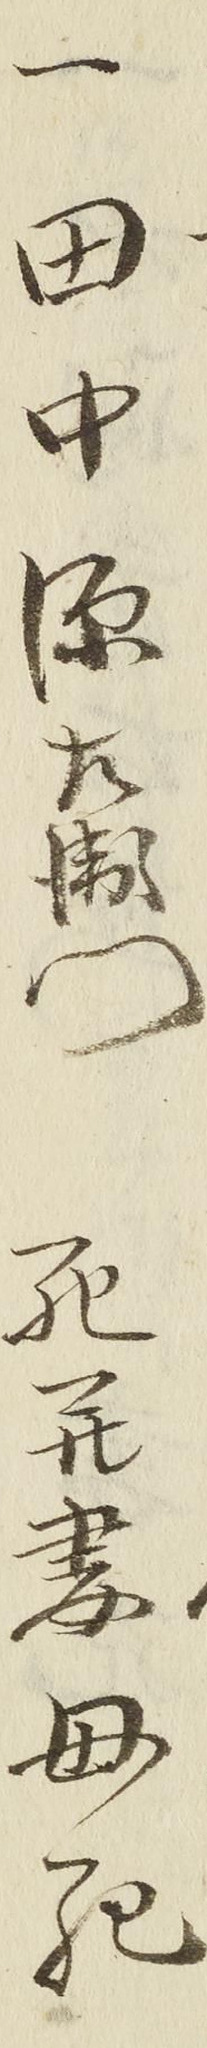一田中源左衛門死并妻母死
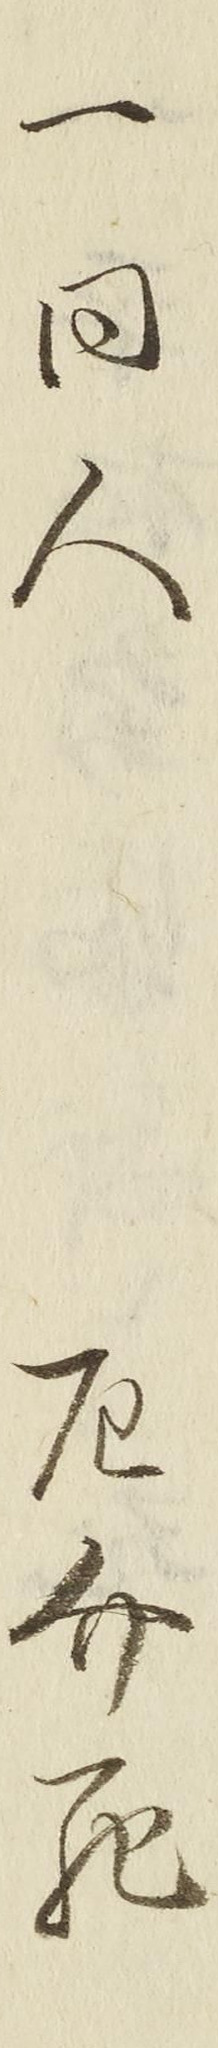一同人厄介者
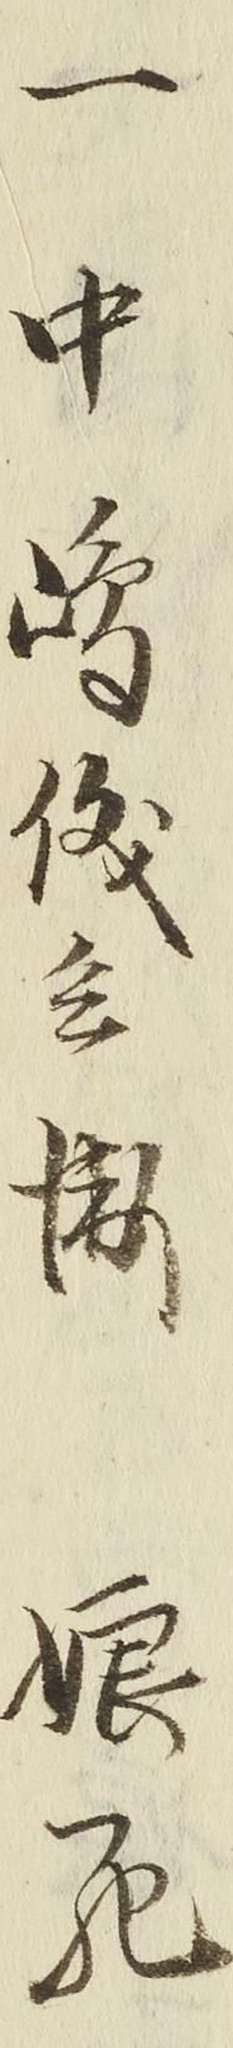一中嶋儀兵衛娘死
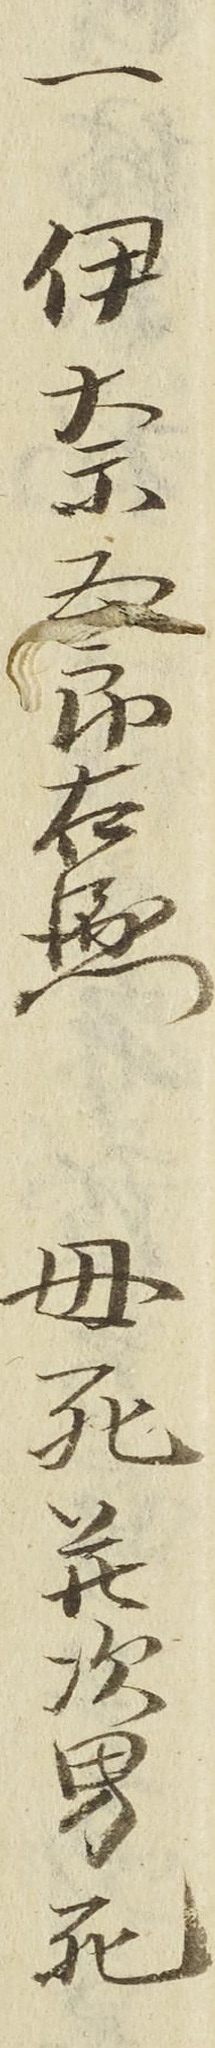一伊奈五郎右衛門母死并次男死
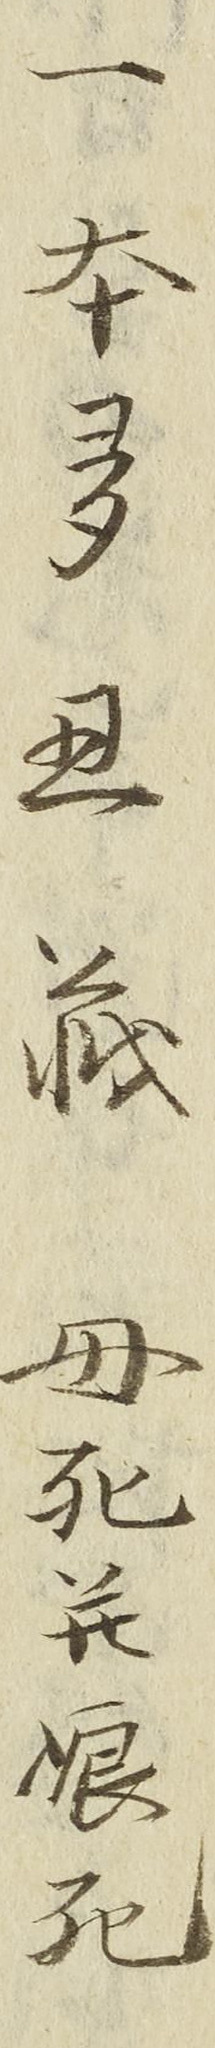一本多丑蔵母死并娘死
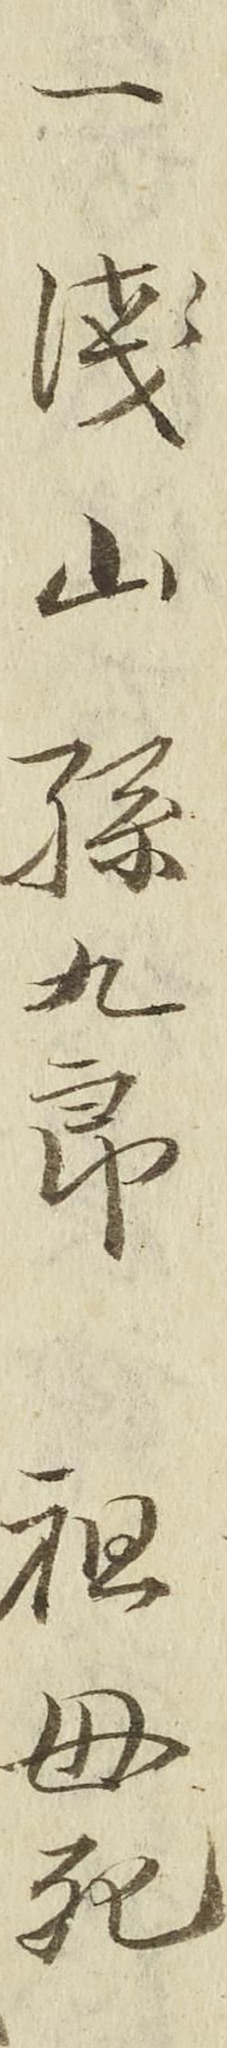一浅山孫九郎祖母死
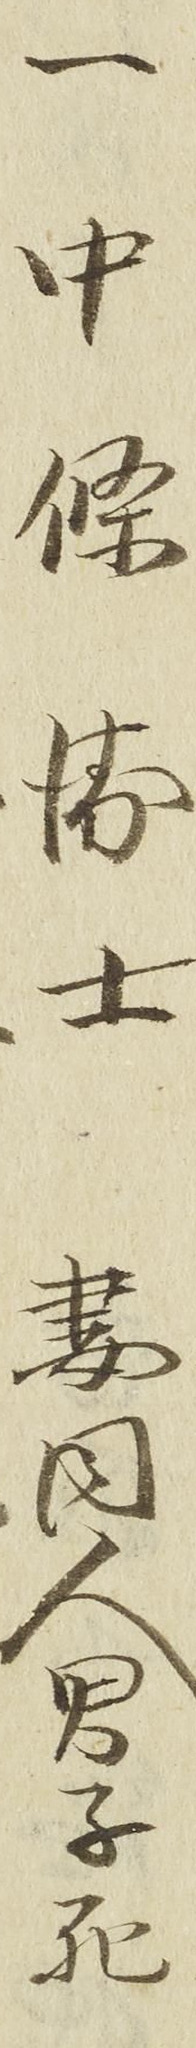一中條衛士妻同人男子死
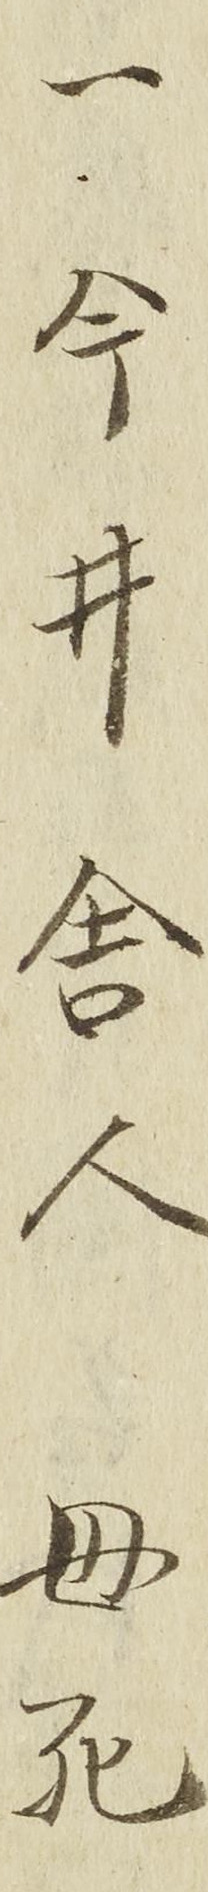一今井舎人母死
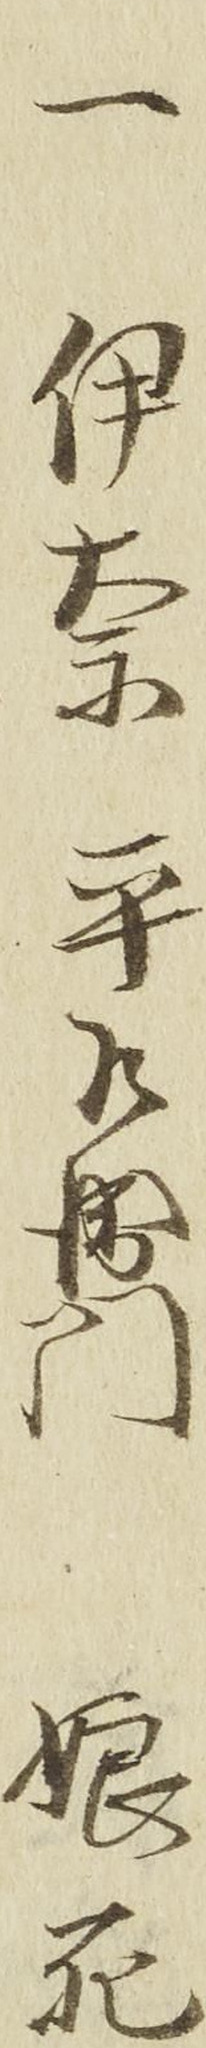一伊奈平左衛門娘死
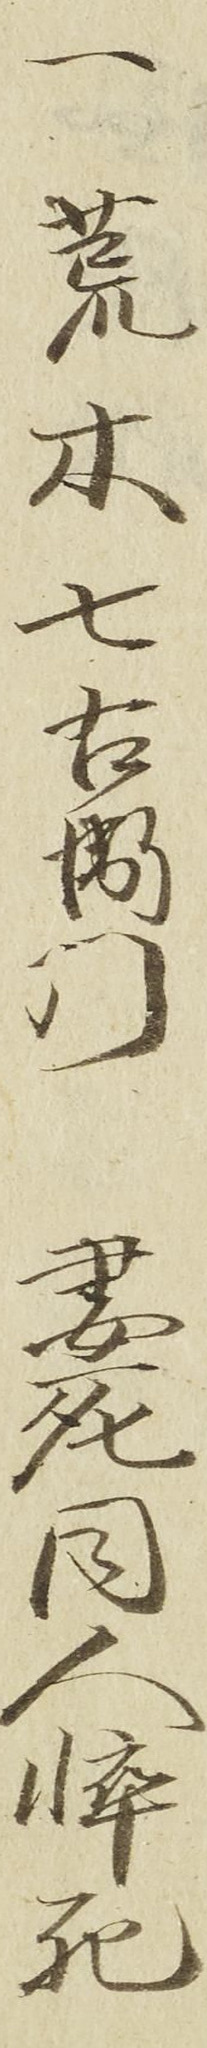一荒木七右衛門妻士同人忰死
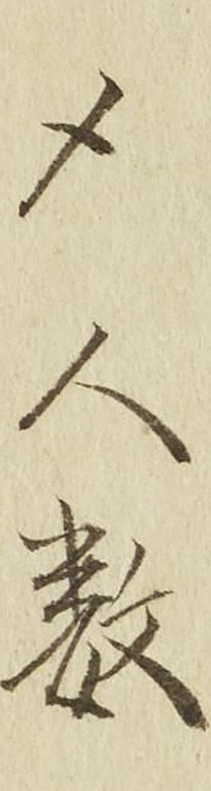〆人数
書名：信濃國大地震記　乾
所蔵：東京大学地震研究所図書室 Earthquake Research Institute Library, The University of Tokyo, JAPAN
